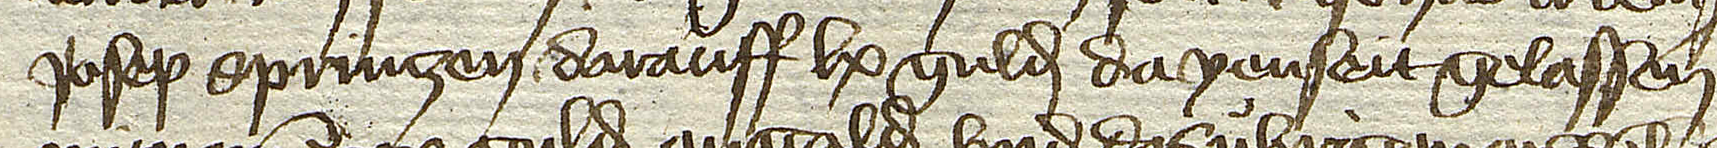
Ioſep sprincʒen / darauff lx guld* da yenſeit gelaſſen
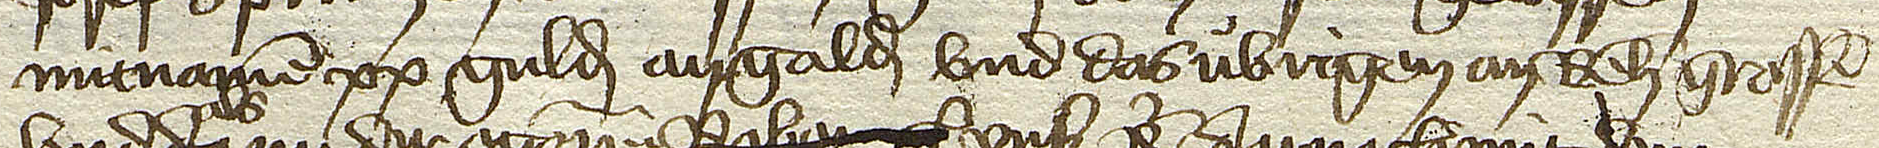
mitname* xx guld* an gold* vnd das übrigen an Beh* groſſe*
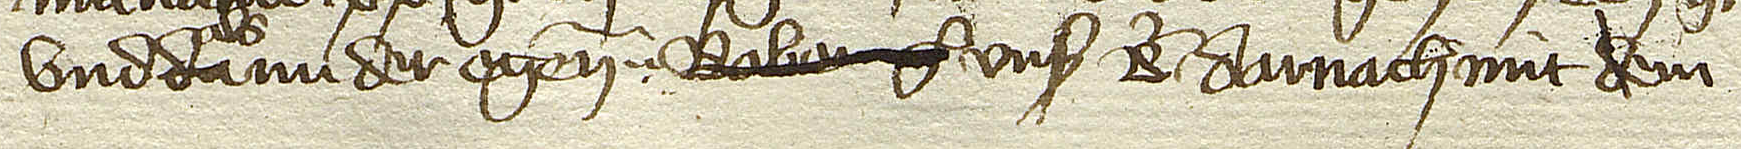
vnd da nu der egen* ~ Babemg* vnſ* B* darnach mit dein
